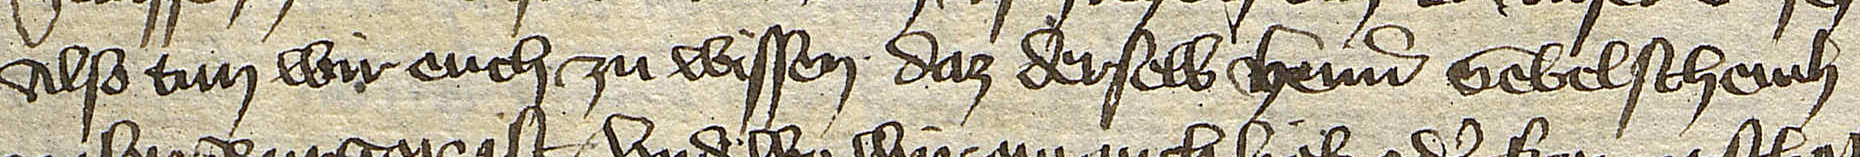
Alſo tun wir euch cʒu wiſſen . daʒ derſelb heinr* Gebelſchewh
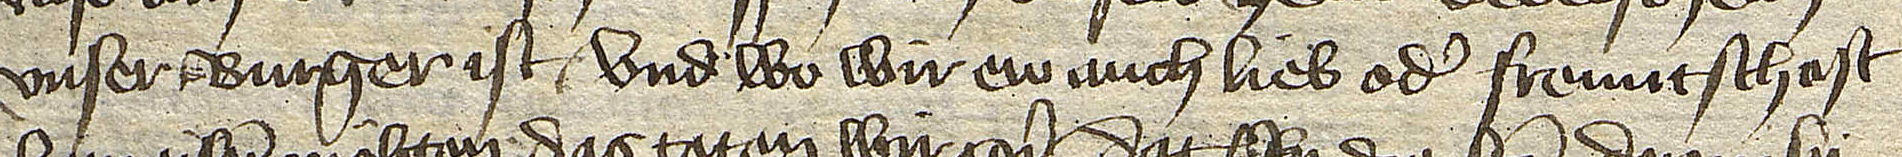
vnſer Burger iſt / vnd wo wir ew auch lieb od* freuntſchaft
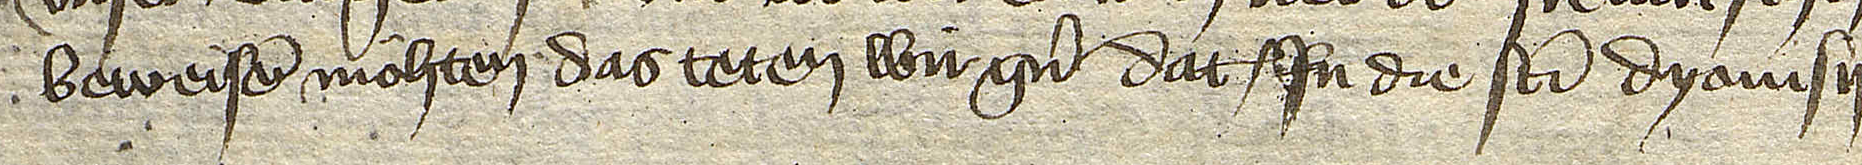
beweiſe* möhten das teten wir g*n dat* In die ſci* dyoniſii
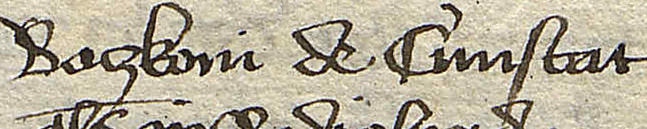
Bocʒkoni de Cunſtat
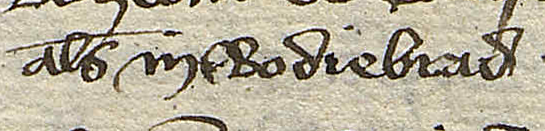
al*s in Bodiebrad
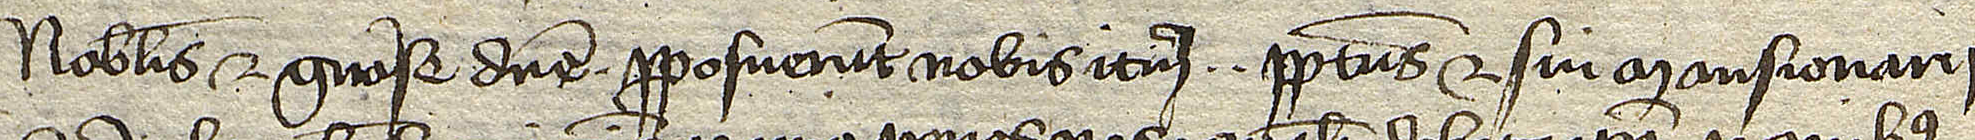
Nob*lis @ g*n*oſe d*ne . p*poſueru*t nobis it*m . . p*p*tus @ ſui Manſionarii
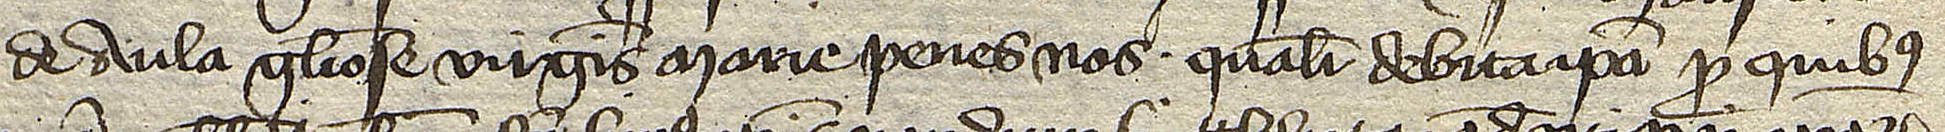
de Aula gl*ioſe virg*is Marie penes nos . quali* debita ip*a p* quib*
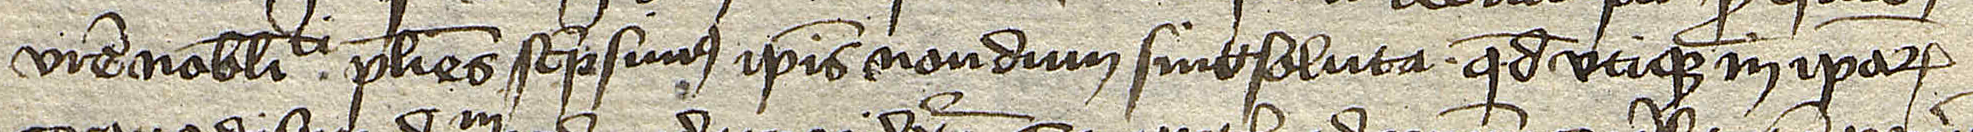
v*re nob*li* pl*ies ſc*pſim* ip*is nondum ſint ſoluta . q*d vtiq* in ip*a*
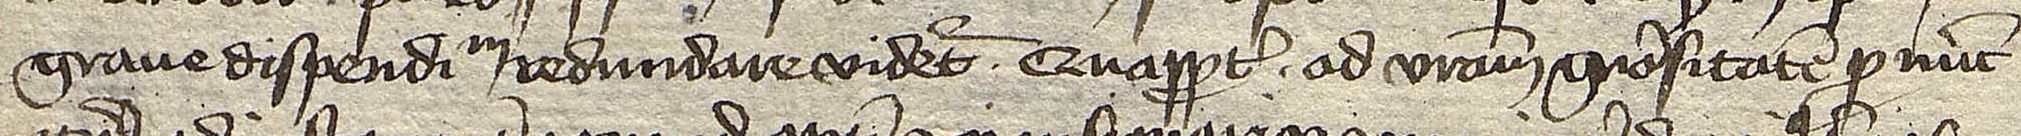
graue diſpendi* redundare videt* . Quap*pt* ad v*ram g*n*oſitate* p* nu*c
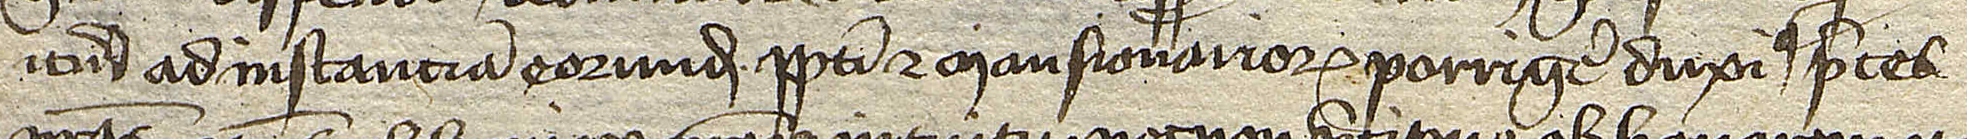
it*m ad inſtancia* eorund* p*p*ti @ Manſionarior* porrige* duxi* p*ces
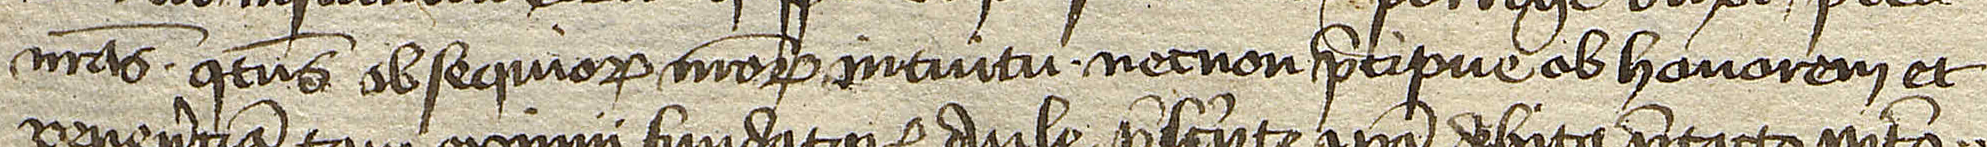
n*ras . q*t*us obſequior* n*ro* intuitu . necnon p*cipue ob honorem et
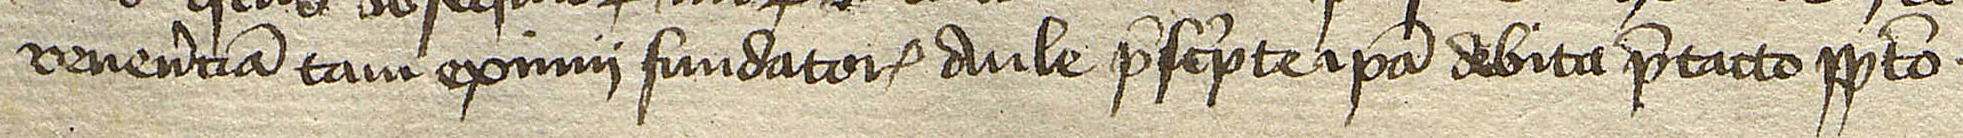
reue*ncia* tam eximii fundator* Aule p*ſc*pte ip*a debita p*tacto p*p*to qui p*p*a . .
